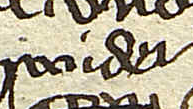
wider
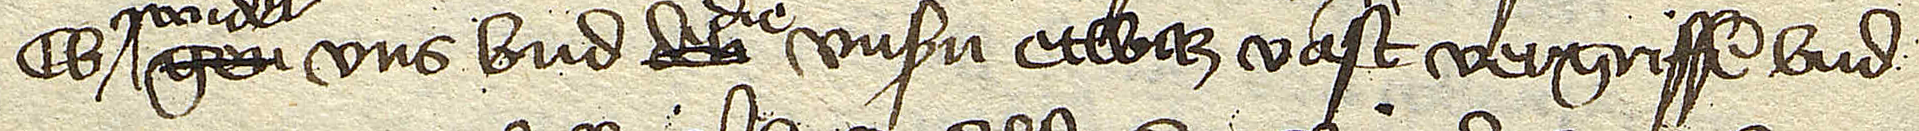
Eb* gen vns vnd den vnſ*n etwaʒ vaſt vergriffe* vnd
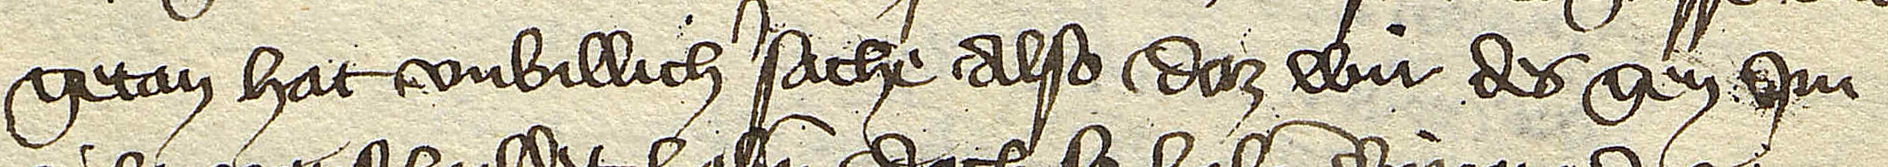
getan hat vnbillich* ſache / Alſo / daʒ wir des gen Im
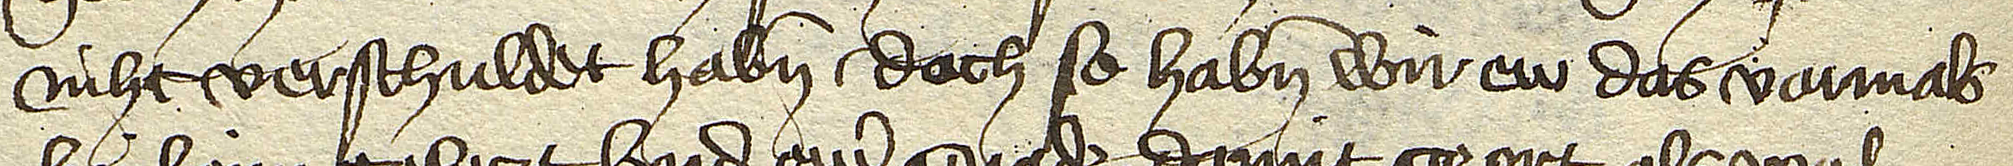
nicht verſchuldet habn* / doch ſo habn* wir ew das vormals
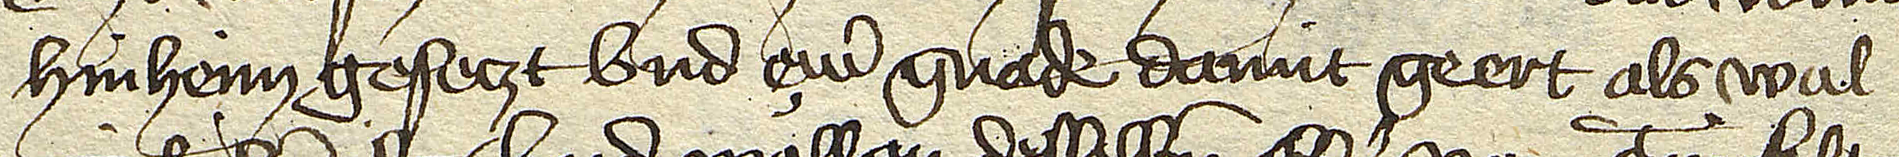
hinheim geſecʒt vnd ew* gnade damit geert als wol
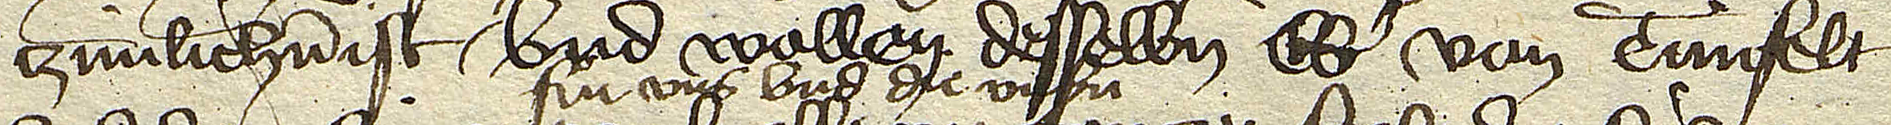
cʒimlichn* iſt / vnd wöllen deſſelbn* Eb* von Tünfelt
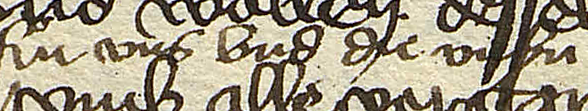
für vns vnd die vnſ*n
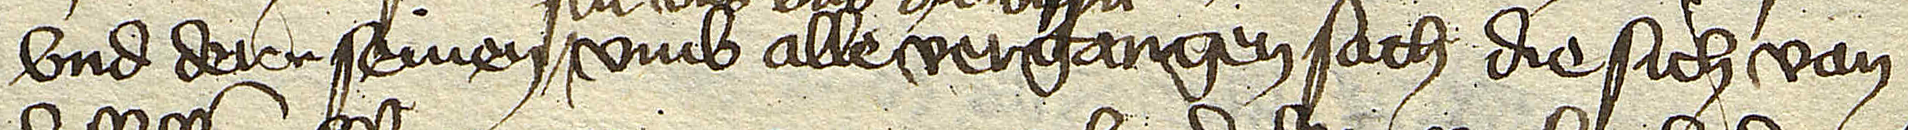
vnd der ~ ſeinen vmb alle vergangen ſach die ſich von
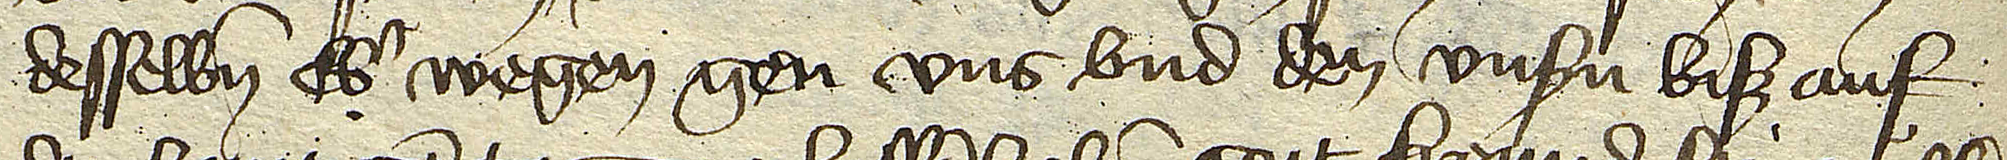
deſſelbn* Eb* wegen gen vns vnd den vnſ*n biſʒ auf
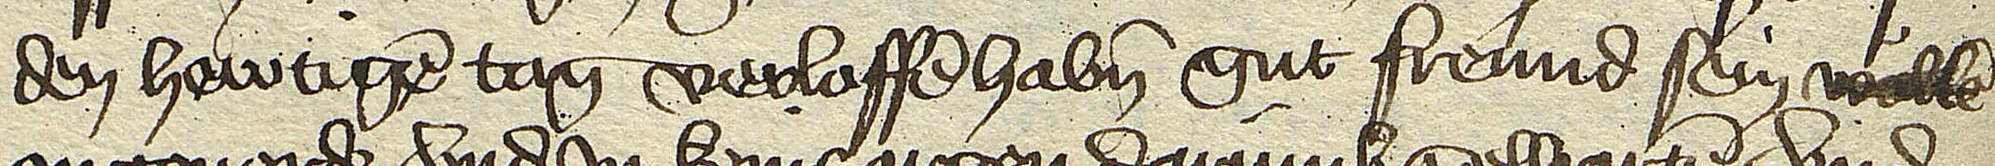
den hewtige* hat verloffe* habn* gut freund ſein wölle*
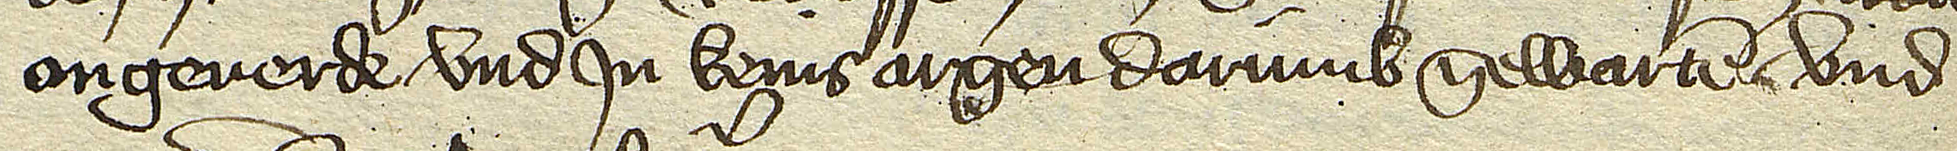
ongeuerde / vnd In keins argen darümb gewarte* / vnd
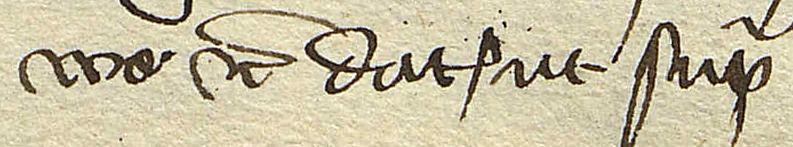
wo ec* dat* ut ſup*
